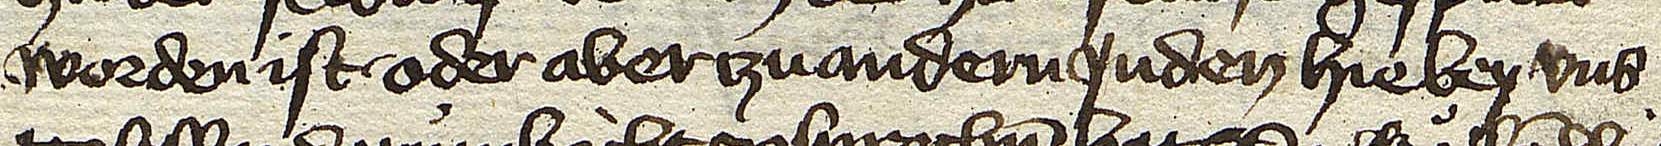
worden iſt / oder aber cʒu andern Iuden hie bey vns
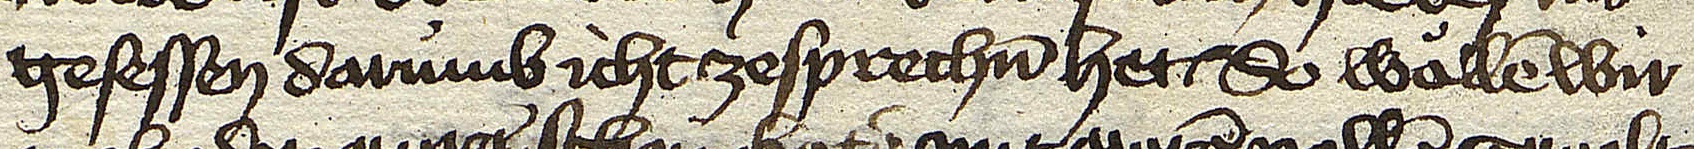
geſeſſen darümb icht ʒeſprech*n het / So wölle* wir
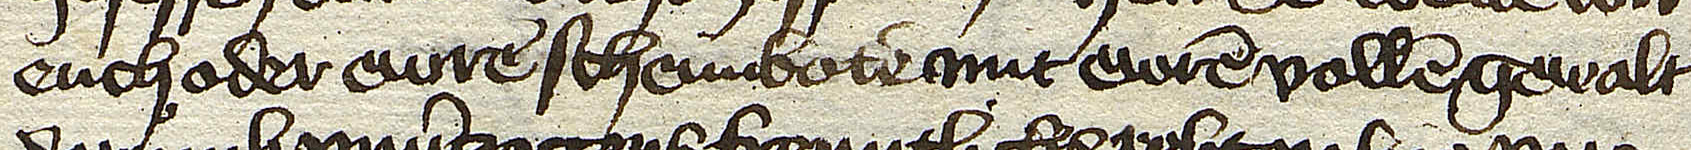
euch oder ewre* ſcheinbote* mit ewre* volle* gewalt
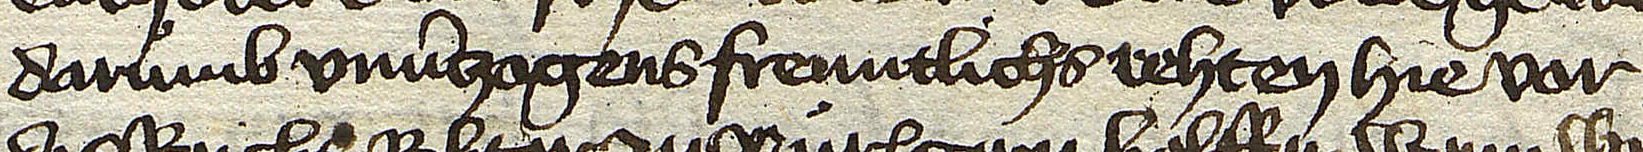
darümb vnu*cʒogens freuntlichs rehten hie vor
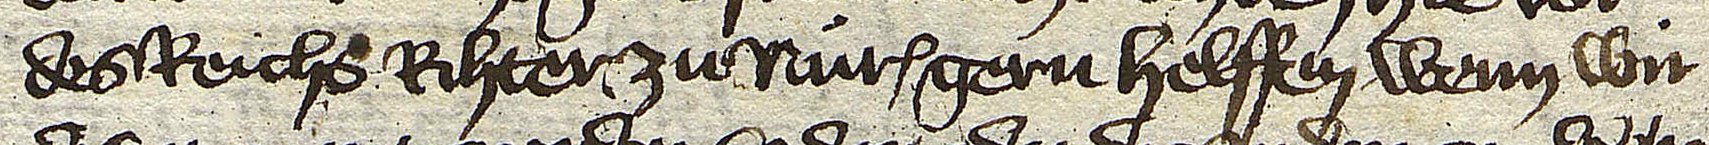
des Reichs Rihter cʒu Nür* gern helffen wenn wir
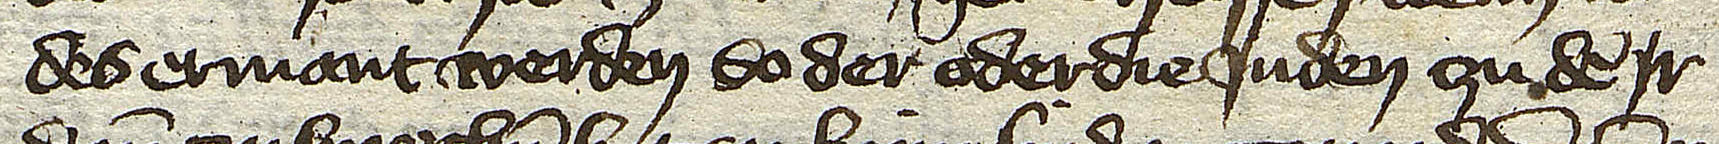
des ermant werden So der oder die Iuden cʒu de* Ir
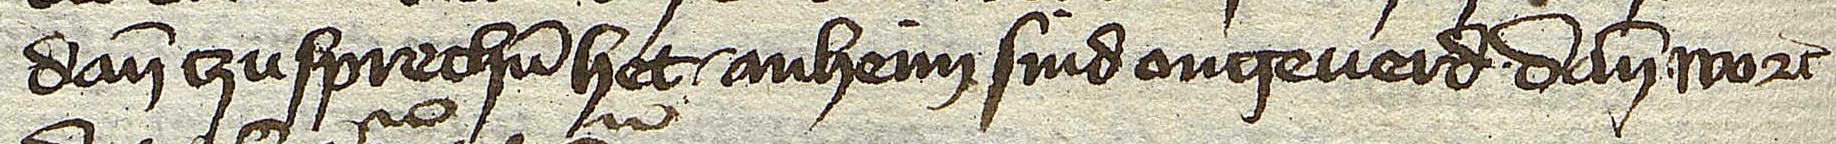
dan* cʒu ſprech*n het / anheim ſind ongeuerd . Dan* wo ec*
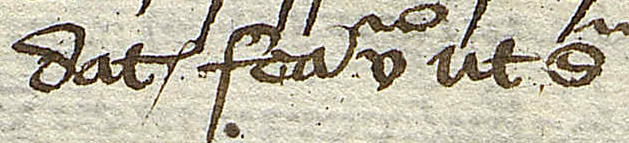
Dat* fe*a v* ut S*
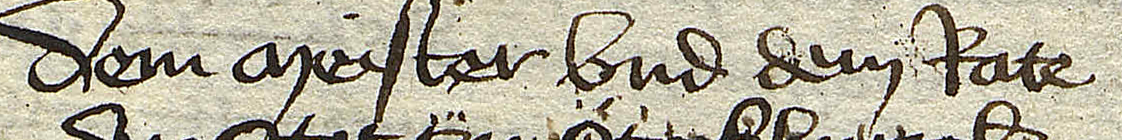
Dem Meiſter vnd dem Rate
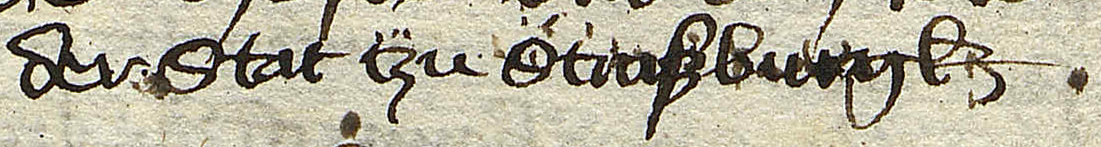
der Stat cʒu Straſʒburgk
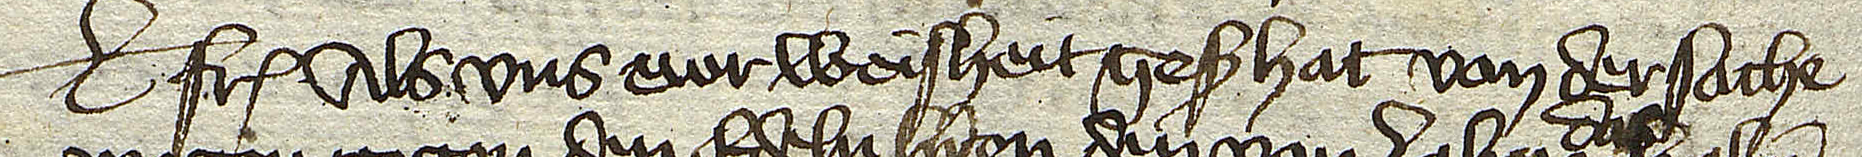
L* fr* Als vns ewr weiſheit geſ* hat von der ſache
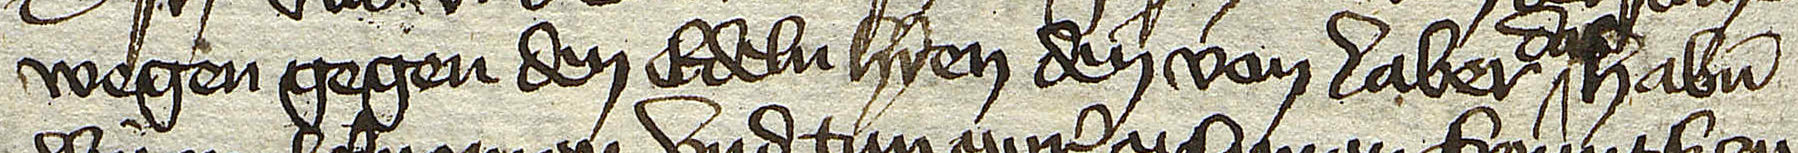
wegen gegen den Edeln h*ren den von Laber hab*n
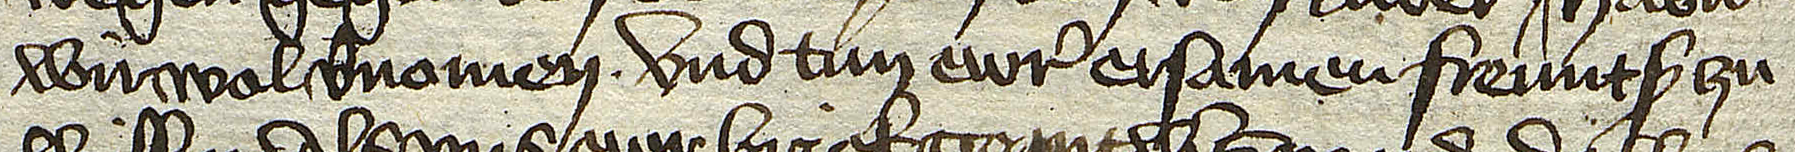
wir wol v*nomen . vnd tun ewr* erſamen freuntſ* cʒu
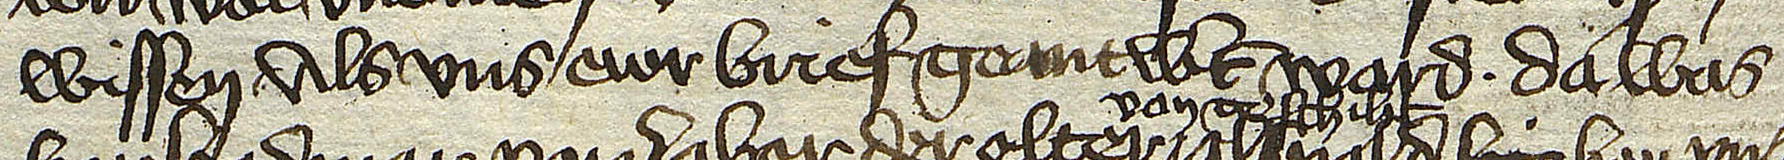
wiſſen / Als vns ewr brief geantw*t ward . da was
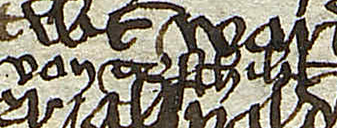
von geſchiht
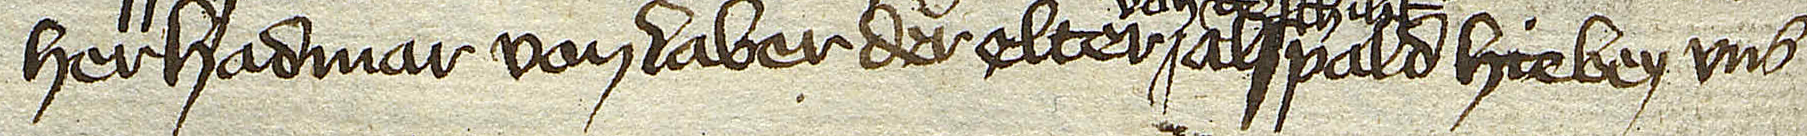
her hadmar von laber der elter alſpald hie bey vns
